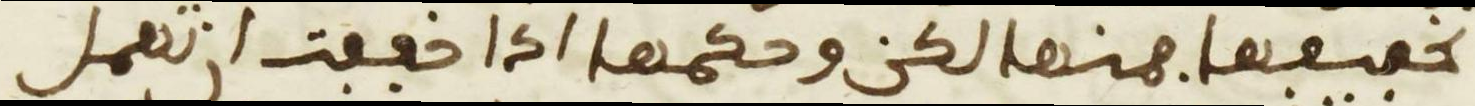تخفيفها فمنها لكن و حكمها اذا خففت ان تهمل
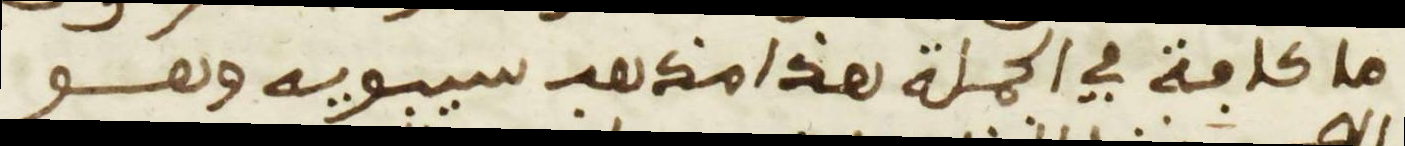ما كافة في الجملة هذا مذهب سيبويه و هو
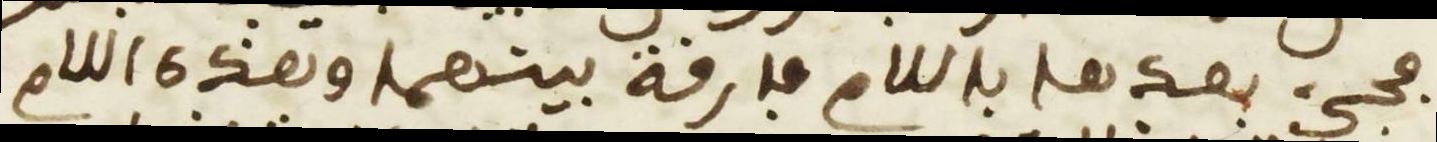فجيء بعدها باللام فارقة بينهما و هذه اللام
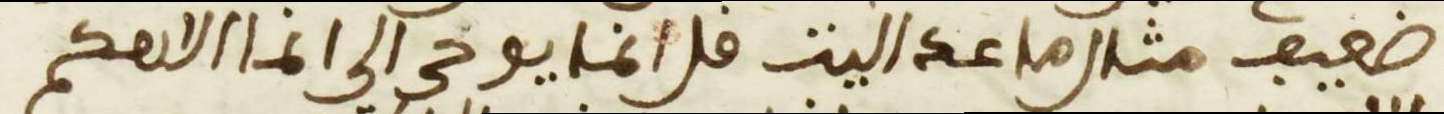ضعيف مثال ما عدا ليت قل انما يوحى الي انما الاهكم
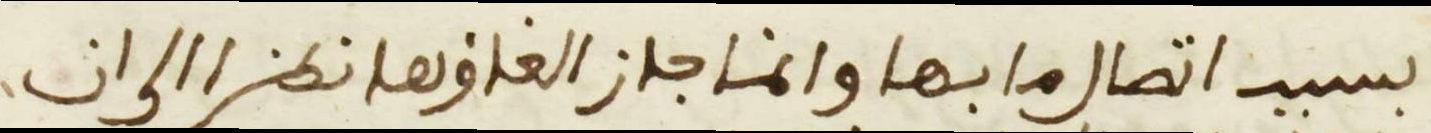بسبب اتصال ما بها و انما جاز الغاؤها نظرا الى ان
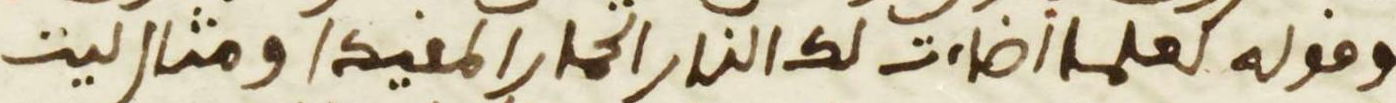و قوله لعلما اضاءت لك النار الحمار المقيد او مثال ليت
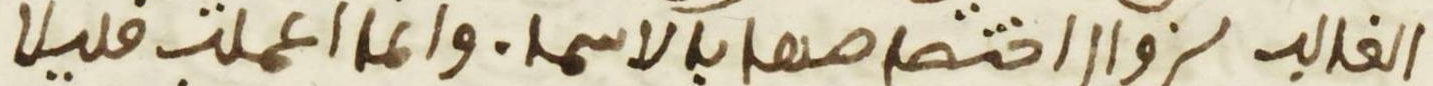الغالب لزوال اختصاصها بالاسماء و انما اعملت قليلا
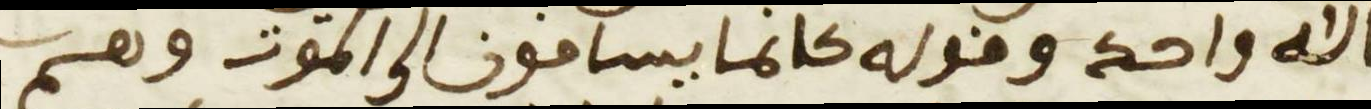الله واحد و قوله كانما يساقون الى الموت و هم
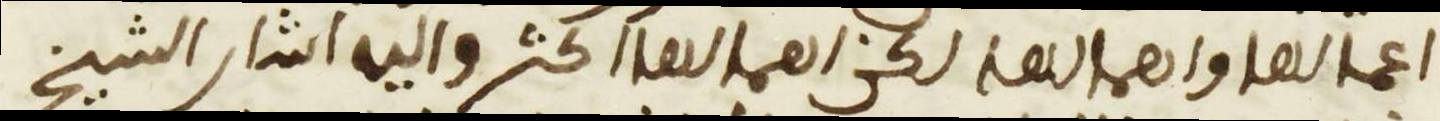اعمالها و اهمالها لكن اهمالها اكثر و اليه اشار الشيخ
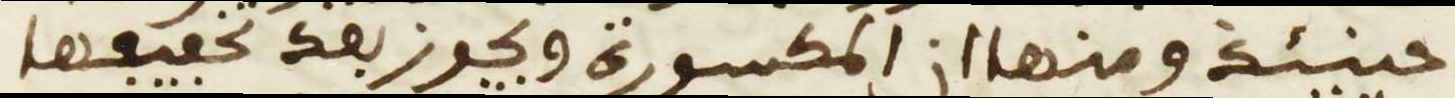حينئذ و منها ان المكسورة و يجوز بعد تخفيفها
